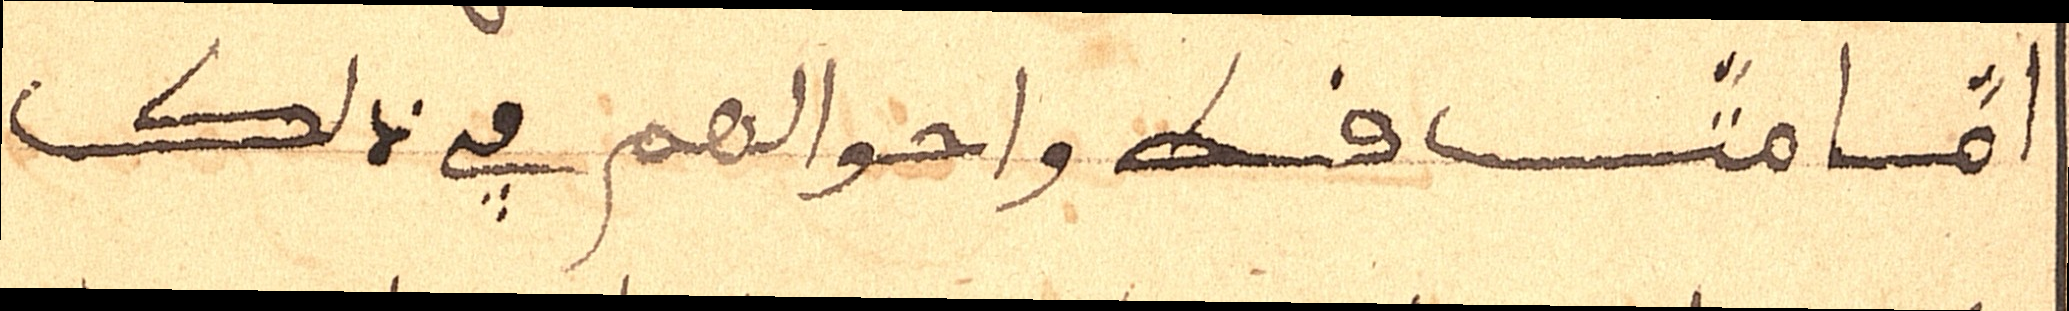اما مت قط واحوالهم في ذلك
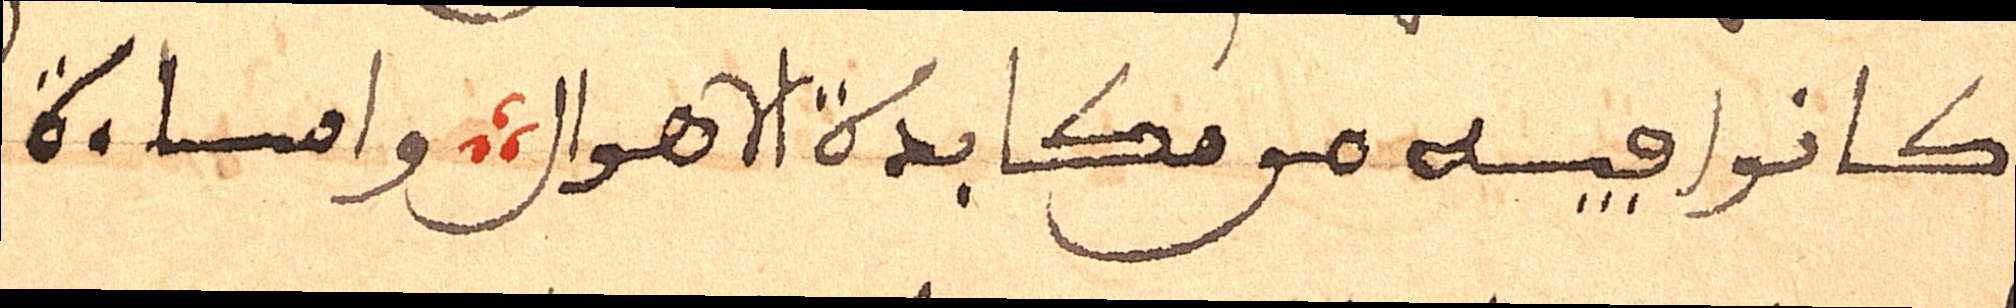كانوا فيه من مكامدة الاهوال واساءة
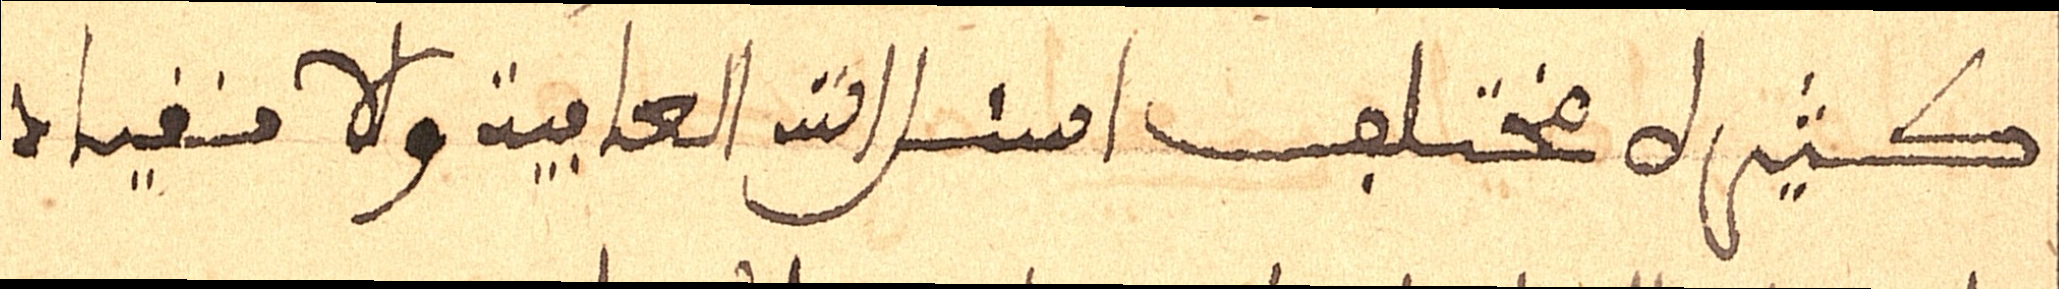كثيره مختلف اسئل الله العافية والا ققياد
